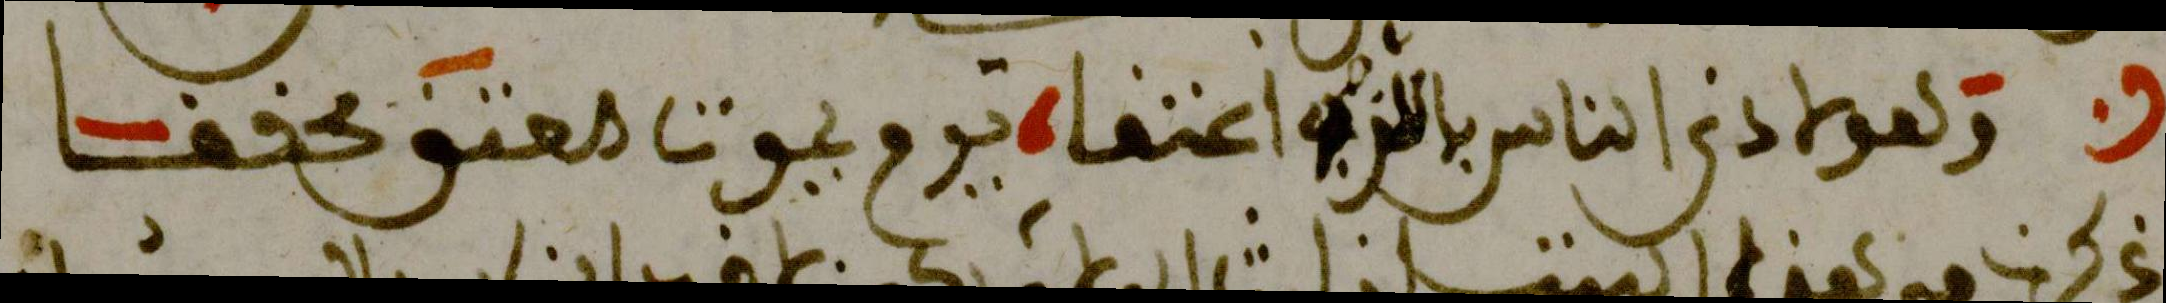وهو لادنى الناس باللذ ## اعتقا يوم يموت معتق محققا
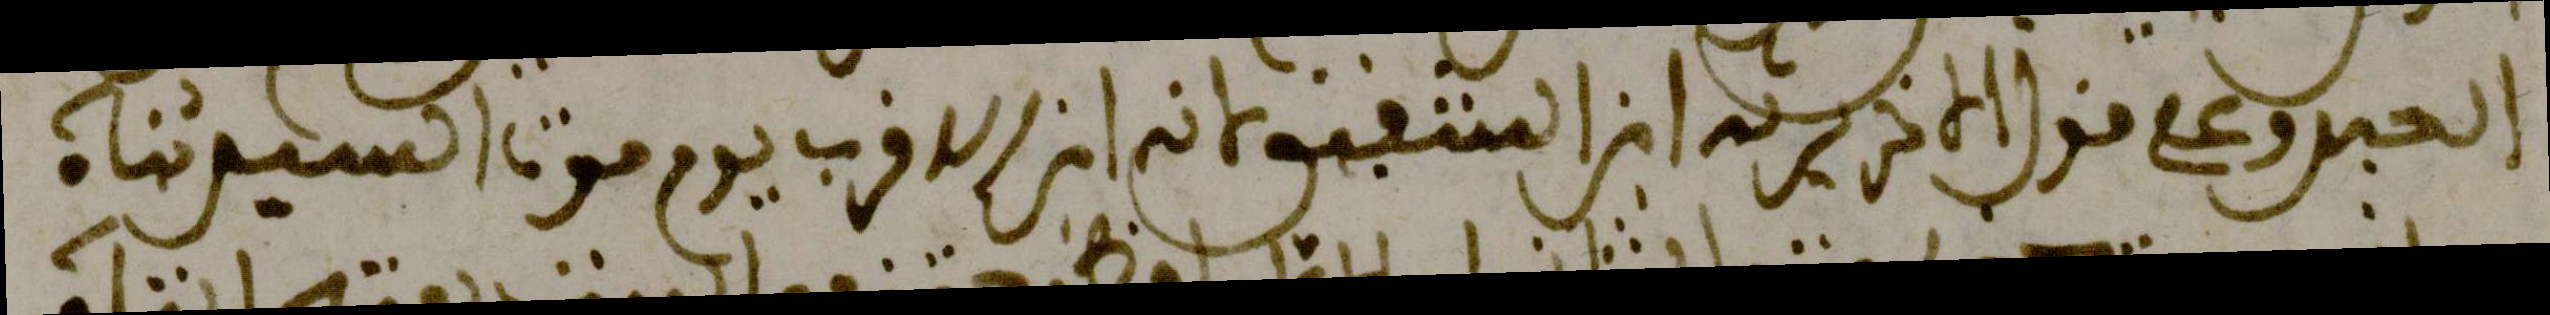العبد وعلى قول الاخر يرثه ابن الشقيق لانه ابن الاقرب يوم موت السيد بناء
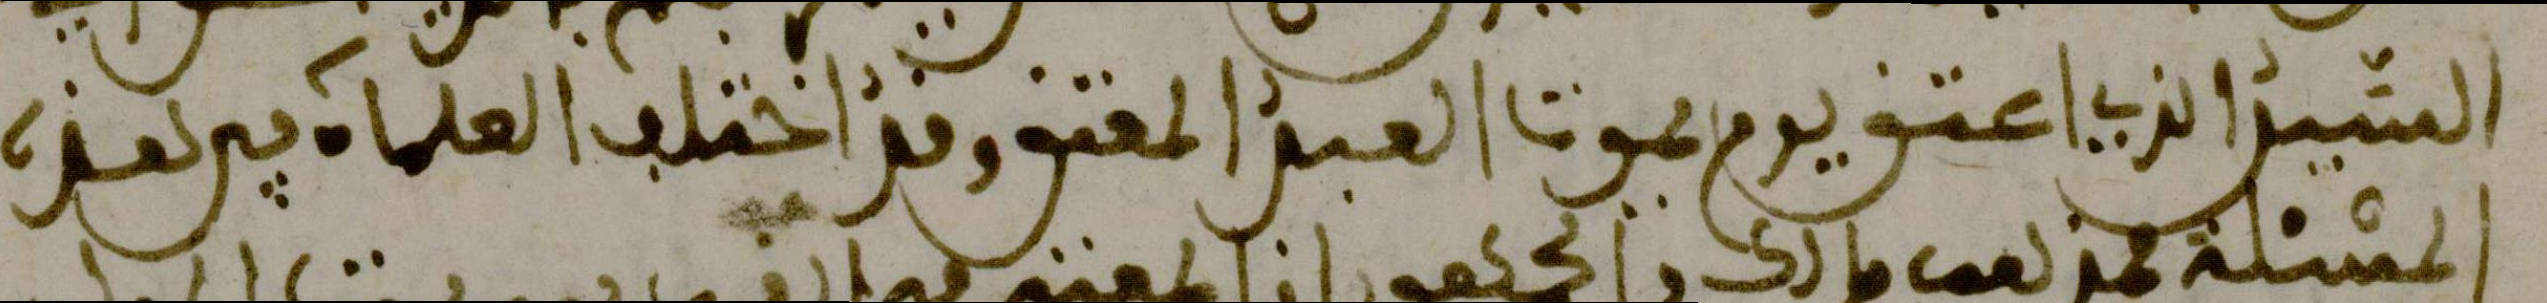السّيد الذي اعتق يوم يموت العبد المعتق وقد اختلف العلماء في هذه
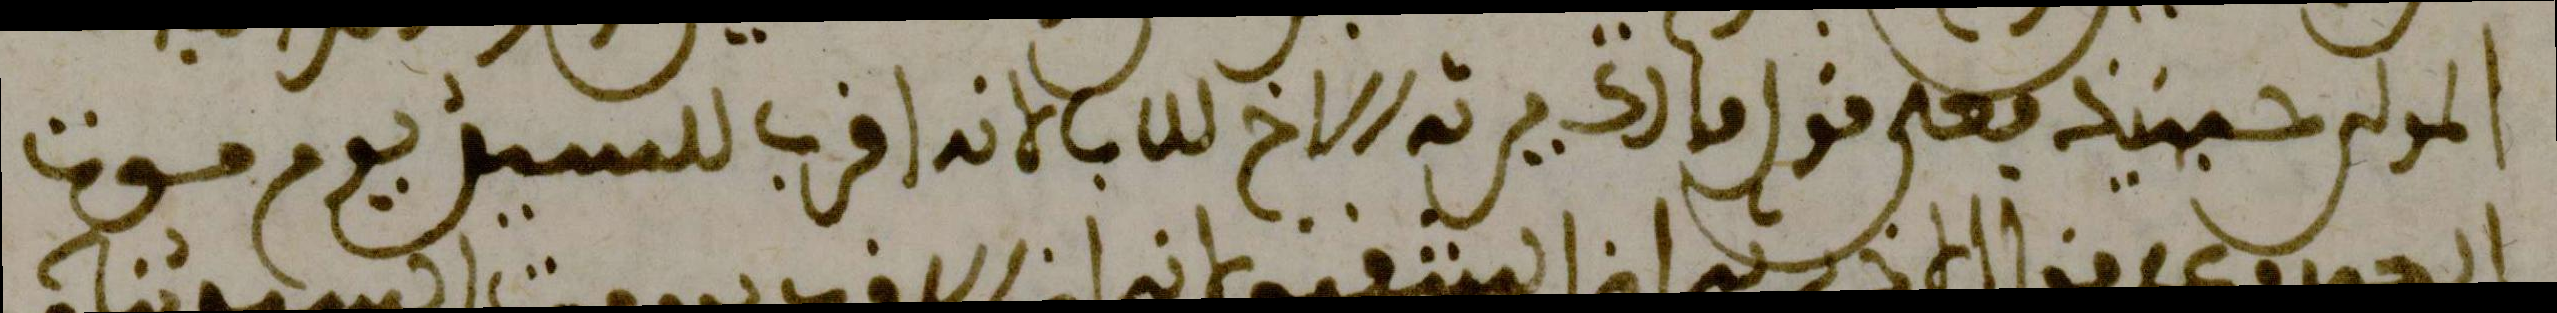المولى حينيذ فعلى قول مالك يرثه الاخ للاب لانه اقرب للسيد يوم موت
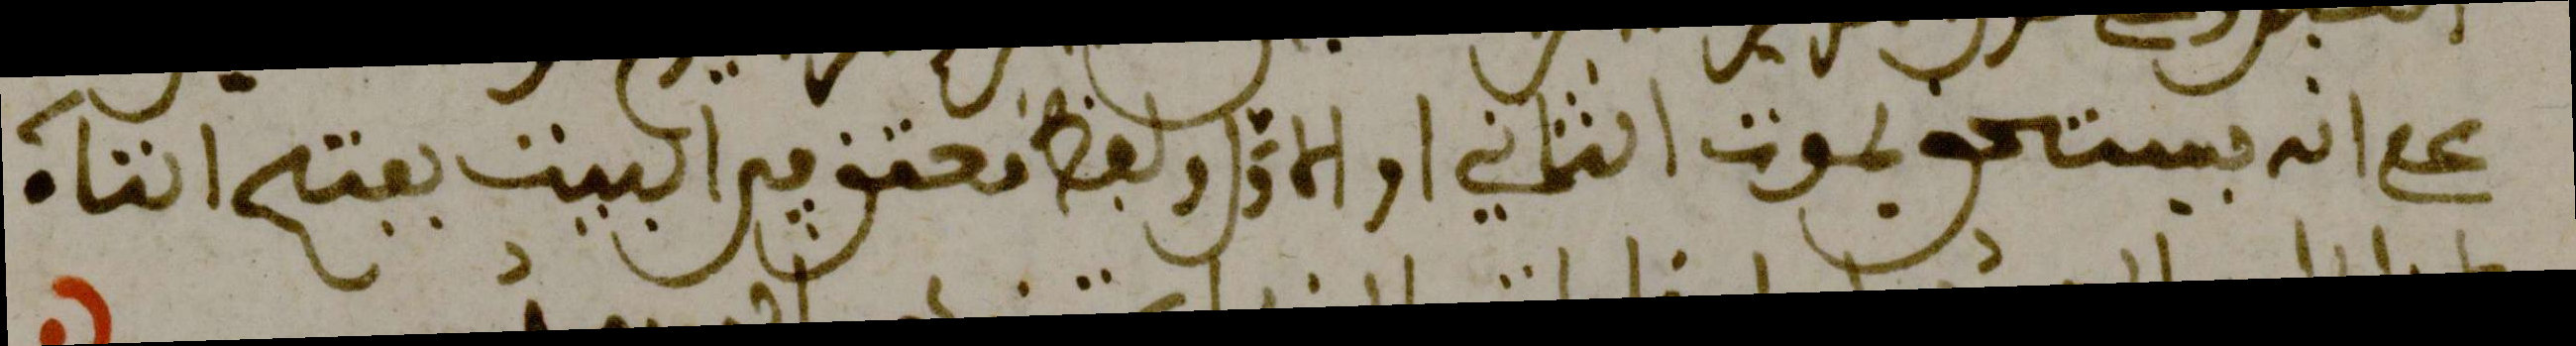على انه يستحق بموت الثاني او الاوّل ولفظ معتق في البيت يفتح التاء
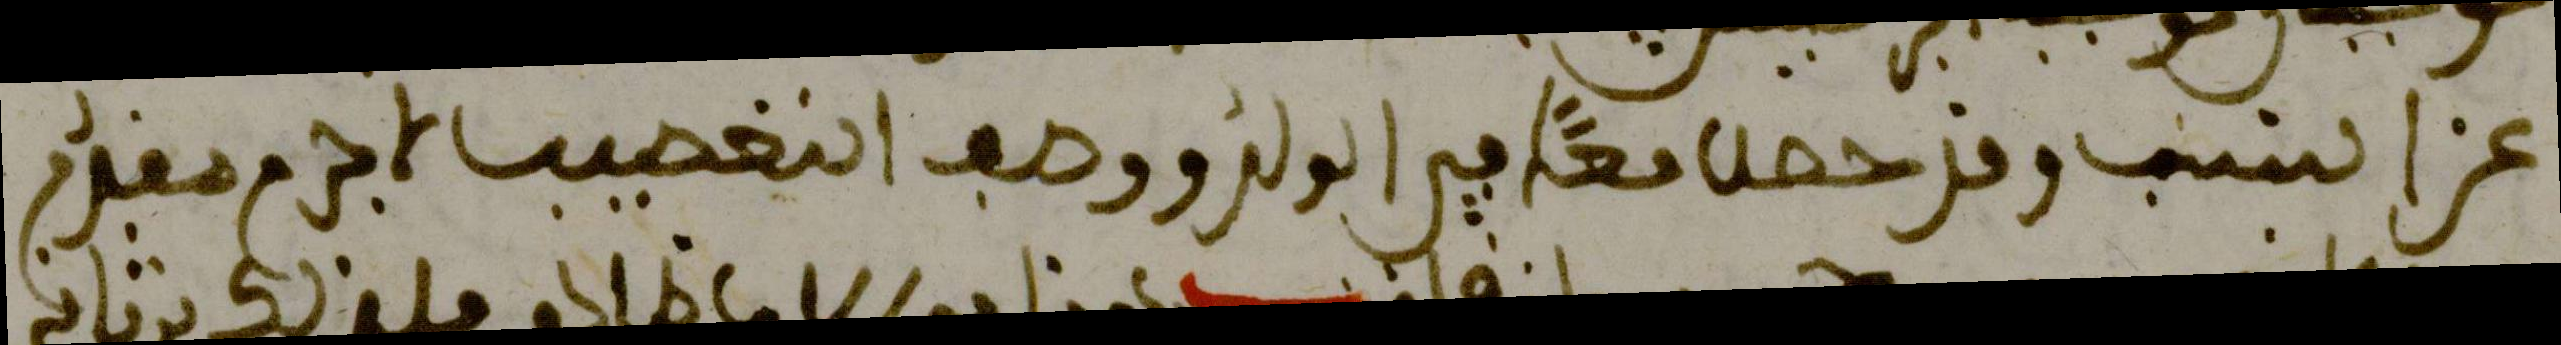عن النسب وفد حصلا معا في الولد ووصف التعصيب لا جرم مقدم
